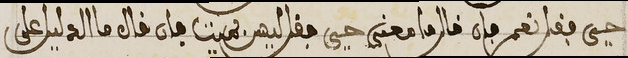حي فقل نعم فان قال ما معنى حي فقل ليس بميت فان قال ما الدليل على
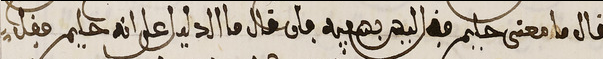قال ما معنى حليم فقل ليس بسعيه فان قال ما الدليل على انه حليم فقل
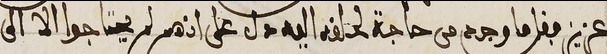عزيز فقل ما وجد من حاجة لخلقه اليه دل على انهم لم يحتا جوا الا الى
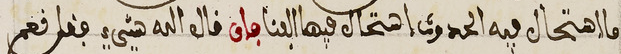ما استحال فيه الحدوث استحال فيها الفنا فان قال الله شيء فقل نعم
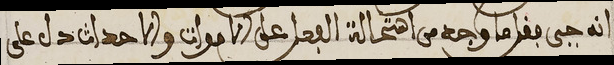انه حي فقل ما وجه من استحالة الفعل على الاموات و الاحداث دل على
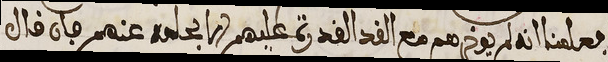فعلمنا انه لم يوخرهم مع القد القدرة عليهم الا بحلمه عنهم فان قال
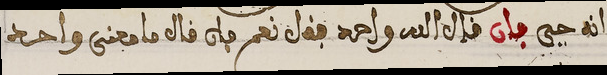انه حي فان قال الله واحد فقل نعم فان قال ما معنى واحد
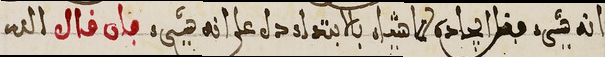انه شيء فقل ايجاده لاشياء بالابتداء دل على انه شيء فان قال الله
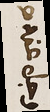وجل عنده
